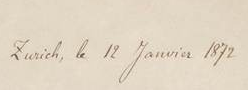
Zurich, le 12 Janvier 1872
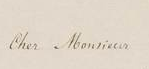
Cher Monsieur
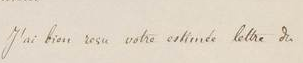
J'ai bien reçu votre estimée lettre du
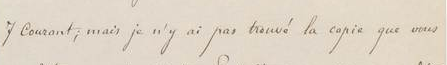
7 Courant; mais je n'y ai pas trouvé la copie que vous
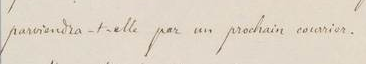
parviendra-t-elle par un prochaine courrier.
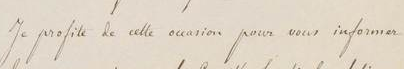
Je profite de cette occasion pour vous informer
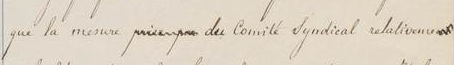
que la mesure prise par du Comité Syndical relativement
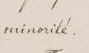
beaucoup contre
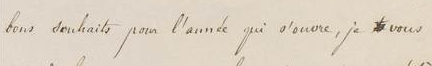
bons souhaits pour l'année qui s'ouvre, je t vous
